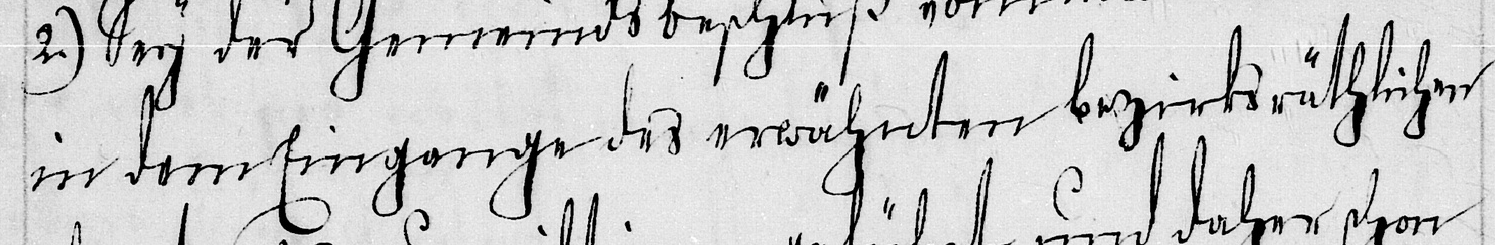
in dem Eingange des erwähnten bezirksräthlichen
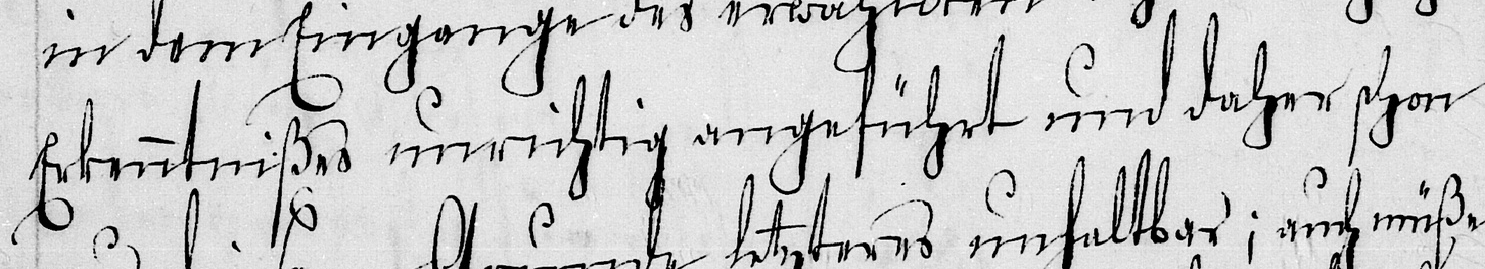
Erkenntnißes unrichtig angeführt und daher schon
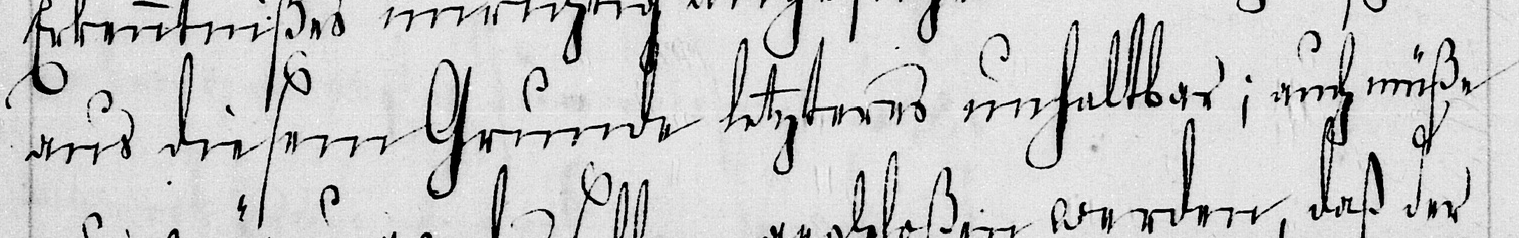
aus diesem Grunde letzteres unhaltbar; auch müße
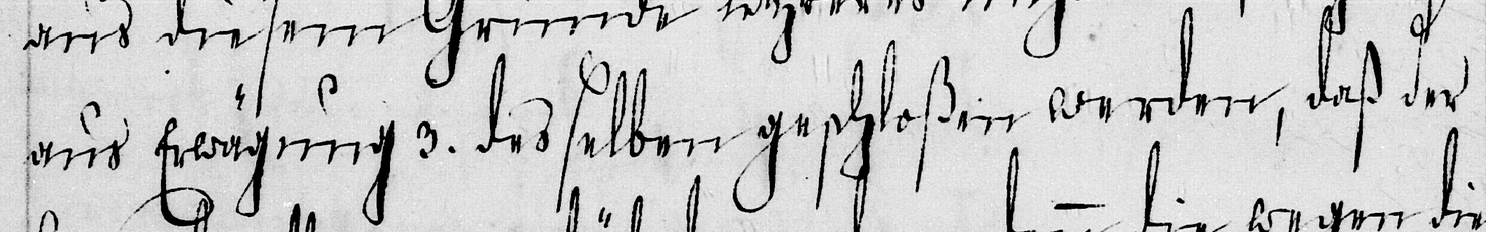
aus Erwägung 3. desselben geschloßen werden, daß der
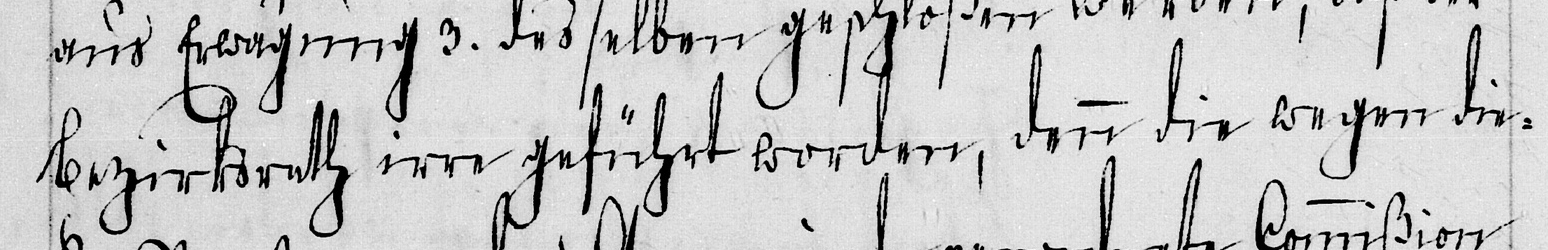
Bezirksrath irre geführt worden, denn die wegen die¬
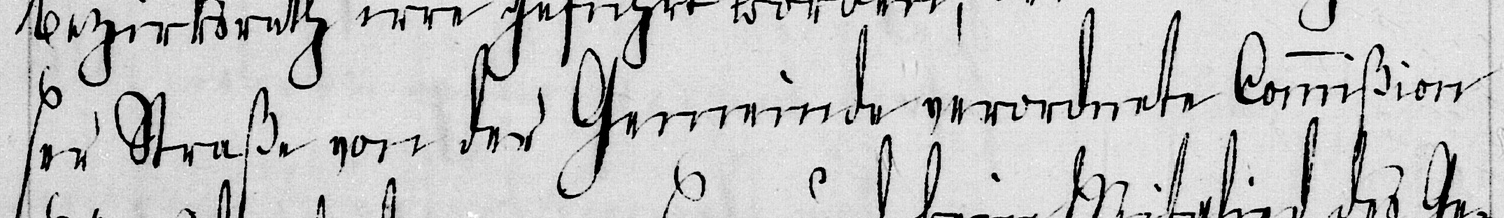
ser Straße von der Gemeinde verordnete Commißion
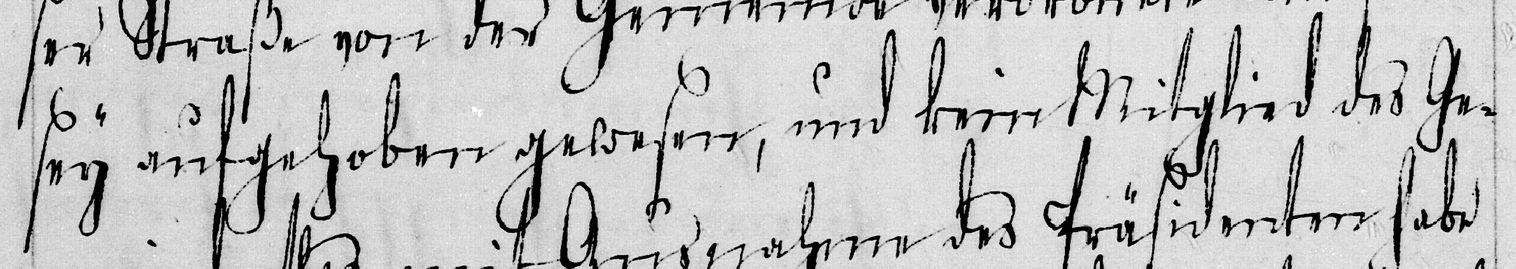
sey aufgehoben gewesen, und kein Mitglied des Ge¬
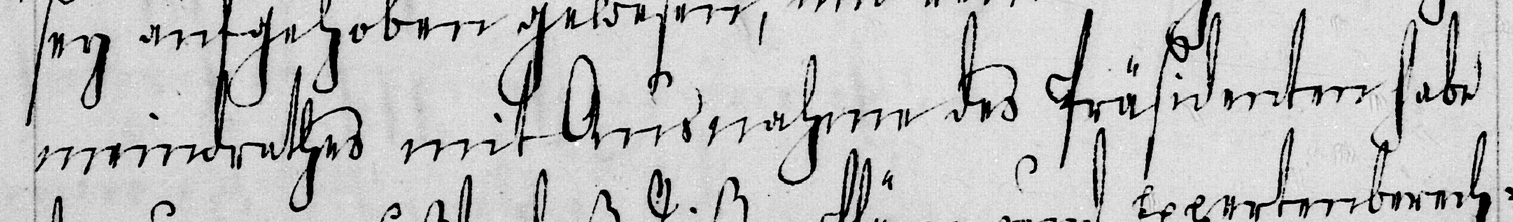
meindrathes mit Ausnahme des Präsidenten habe
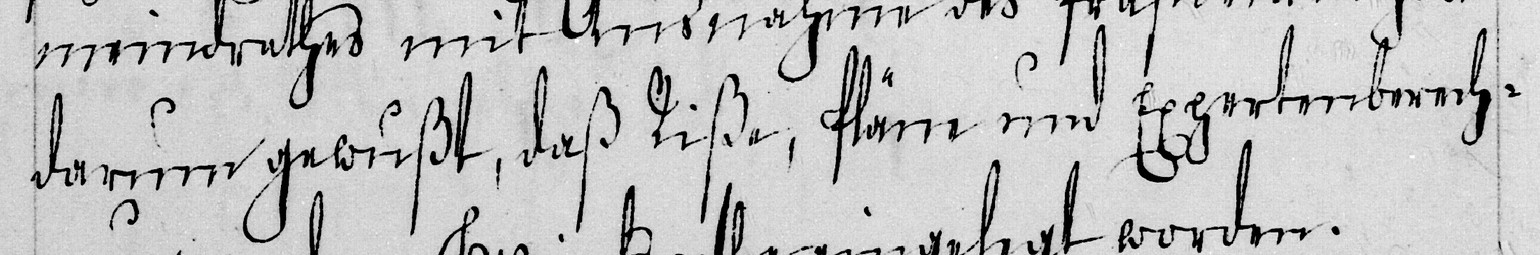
darum gewußt, daß Riße, Pläne und Expertenberech¬
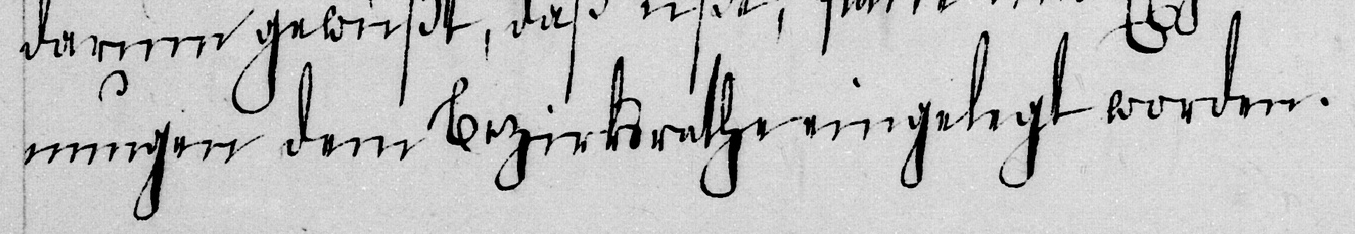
nungen dem Bezirksrathe eingelegt worden.
